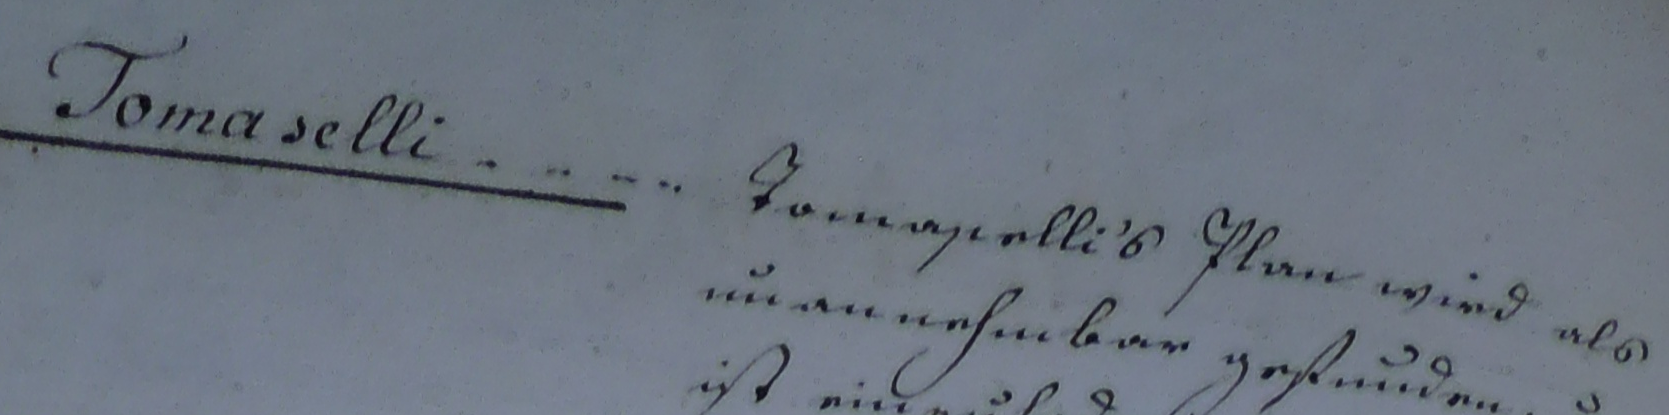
Tomaselli .. .. .. .. Tomaselli's Plan wird als
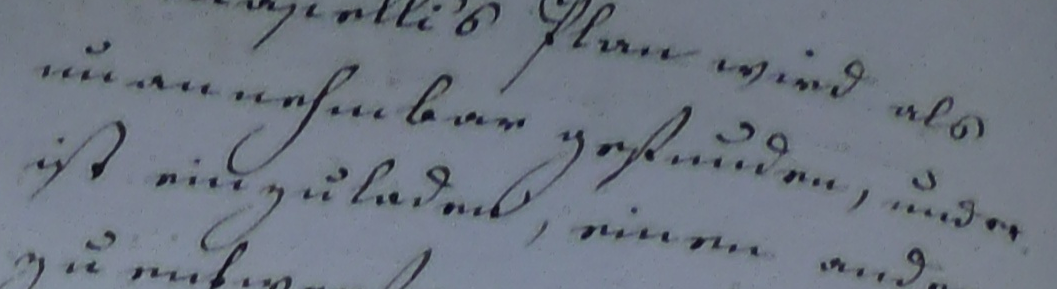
unannehmbar gefunden, und er
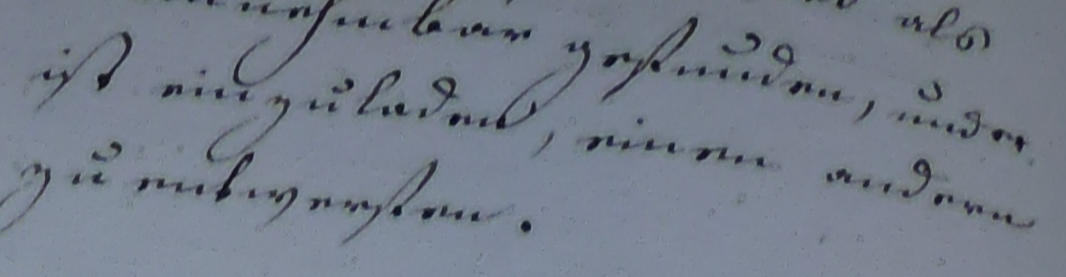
ist einzuladen, einen andern
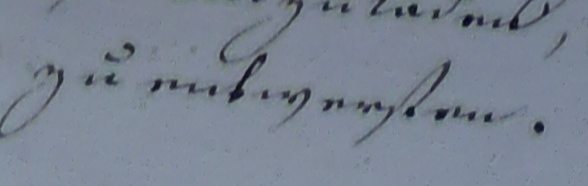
zu entwerfen.
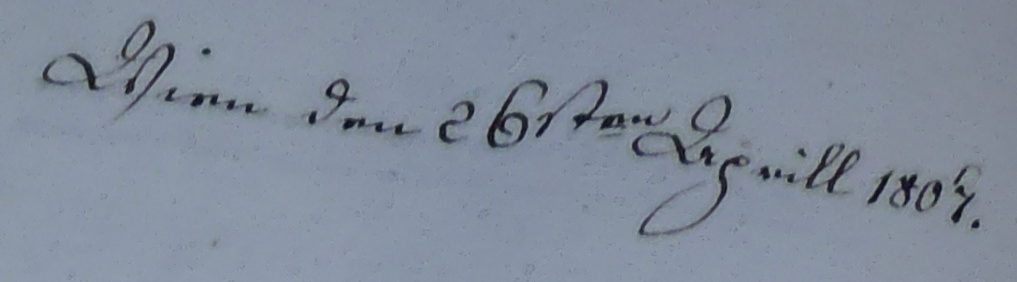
Wien den 26st͇̳en Aprill 1807.
